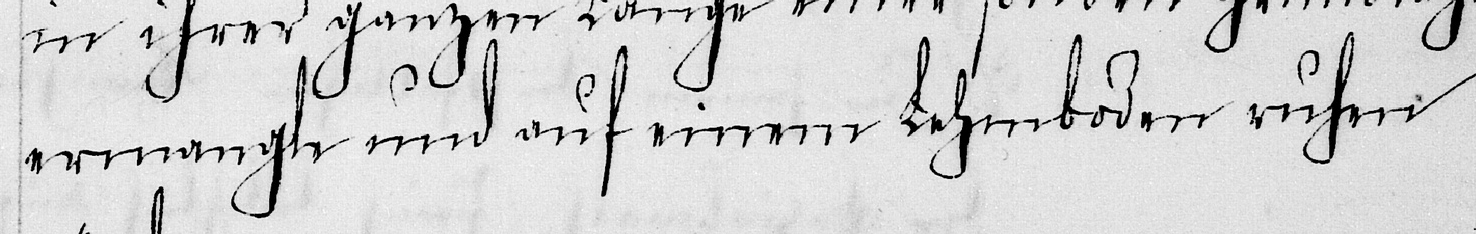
ermangle und auf einem Lehmboden ruhen
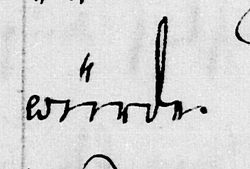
würde.
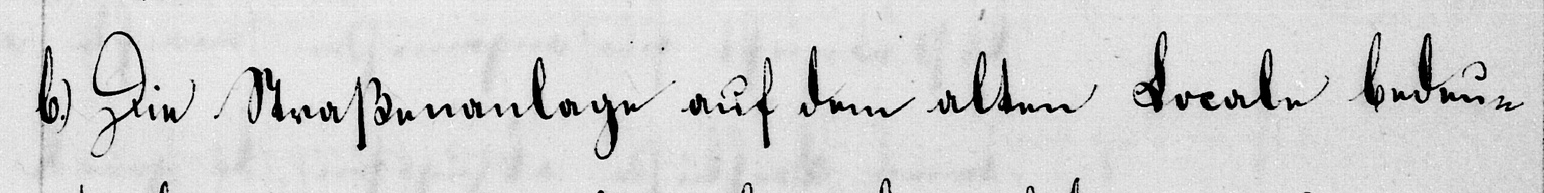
b.) Die Straßenanlage auf dem alten Areale bedeu¬
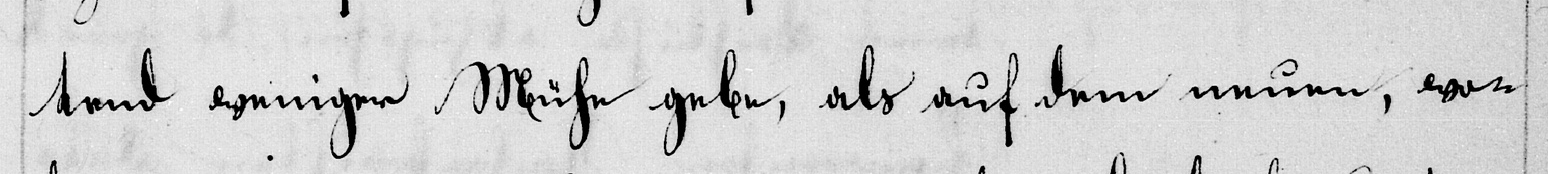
tend weniger Mühe gebe, als auf dem neuen, wo¬
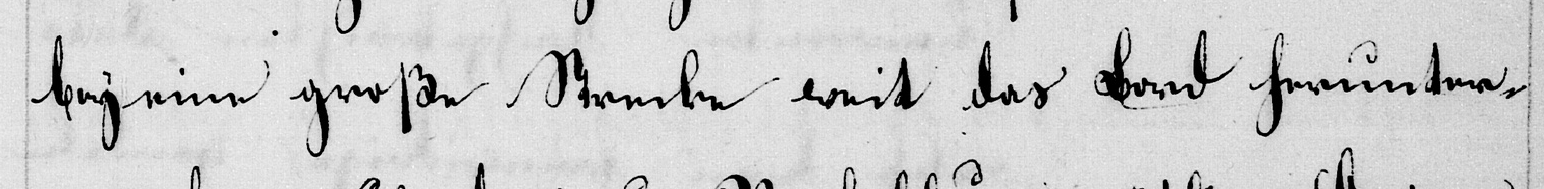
bey eine große Strecke weit das Bord herunter¬
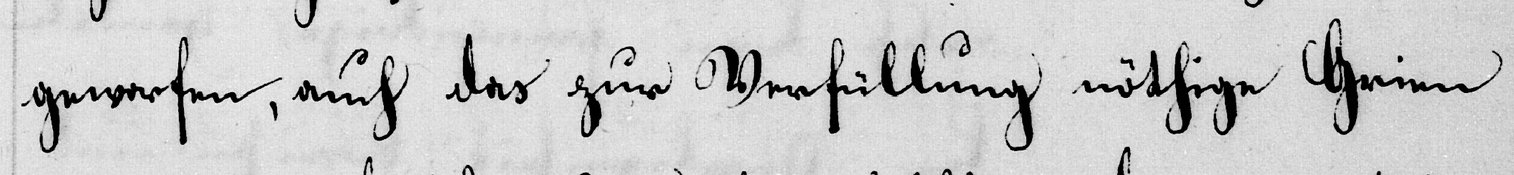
geworfen, auch das zur Verfüllung nöthige Grien
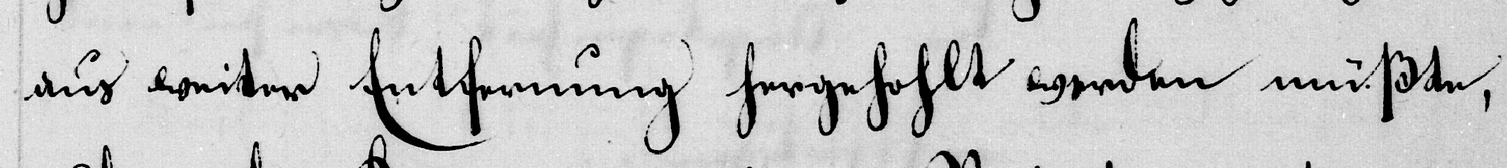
aus weiter Entfernung hergehohlt werden müßte,
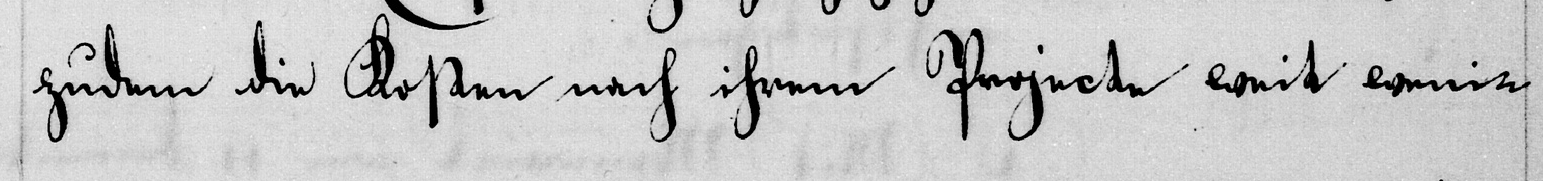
zudem die Kosten nach ihrem Projecte weit weni-
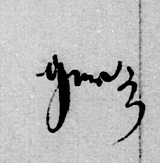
esi¬
